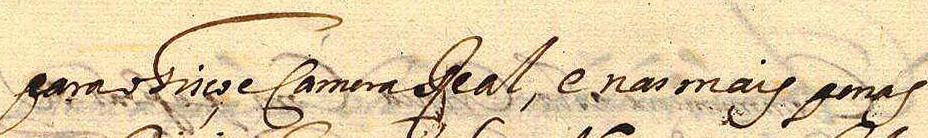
para o Fisco, e Camera Real, e nas mais penas
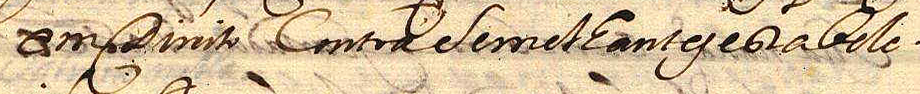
em Direito Contra Semelhantes estabele
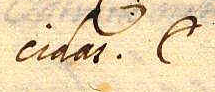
cidas. E
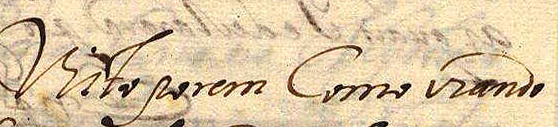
Visto porem Como vzando
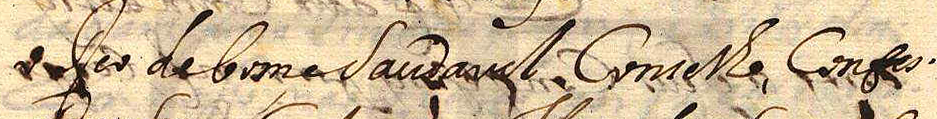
o Reo de bom, e Saudauel Conselho, Confes
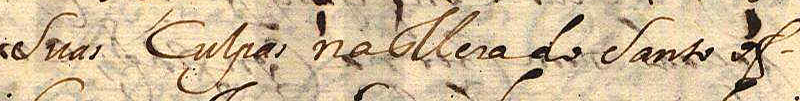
Suas Culpas na Meza do Santo of
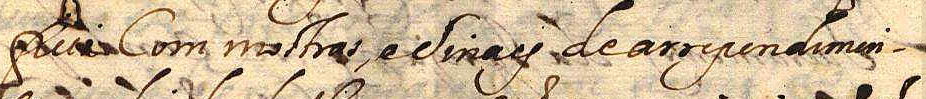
ficio Com mostras, e sinaes de arrependimen
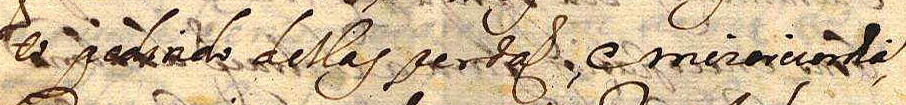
to pedindo dellas perdaõ, e mizericordia,
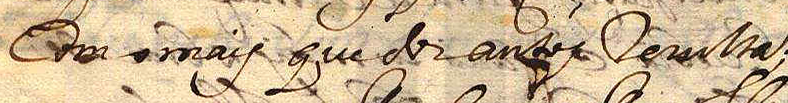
Com o mais que dos autos Rezulta;
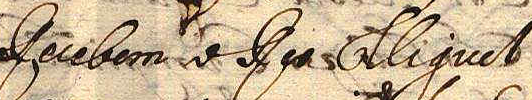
Recebem o Reo Miguel
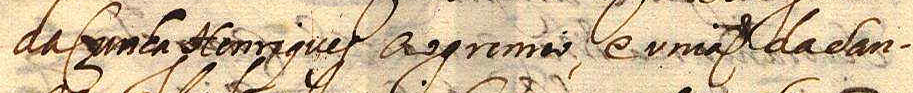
da Cunha Henriques ao gremio, e vniaõ da San
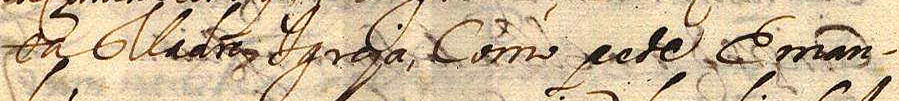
ta Madre Igreja, Como pede E man
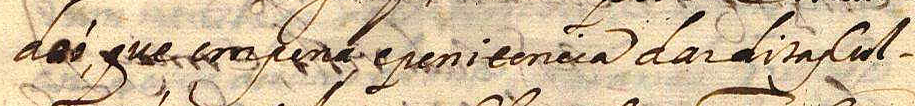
daõ, que em pena, e penitencia das ditas Cul
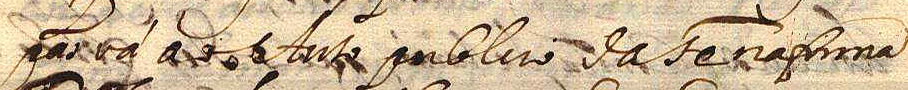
pas vá ao Auto publico da Fe na forma
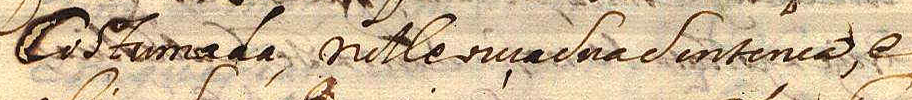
Costumada, nelle ouça Sua Sentença, e
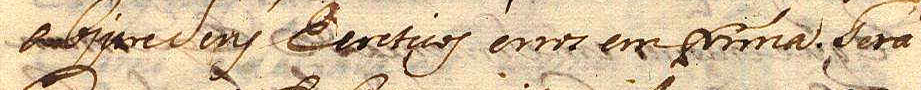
abjure seus hereticos erros em forma. Terá
